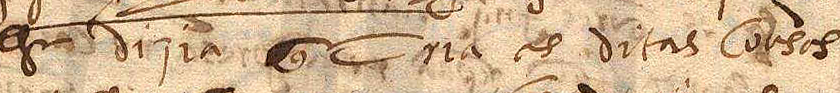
lhe dizia q̄ Cria as ditas cousas
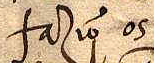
faziō os
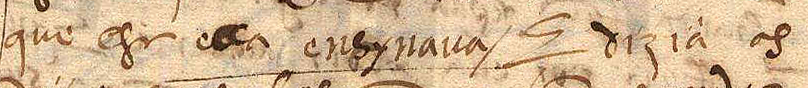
que lhe ella ensynaua / E dizia as
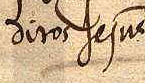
ditos Jejūs
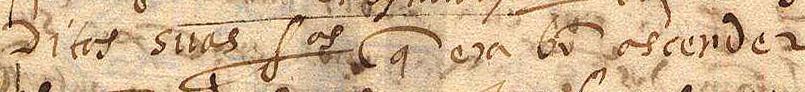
ditas suas fas q̄ era bō ascender
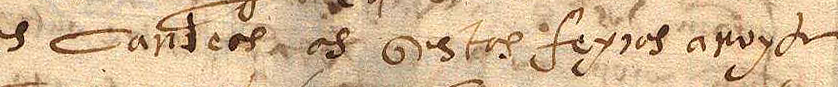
as candeas as sestas feyras a noyte
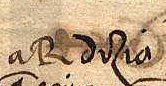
a R. dizia
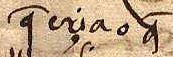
q̄ cria o q̄
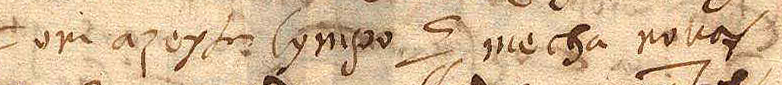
com azeyte lympo E mecha noua /
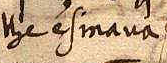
lhe ēsinaua
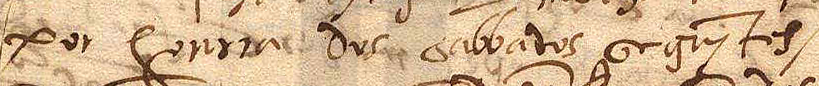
por honrra dos sabbados seguj̄tes /
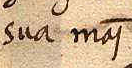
sua maj
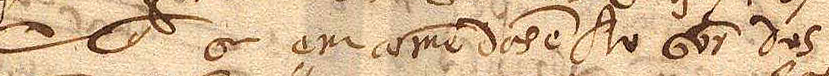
e q̄ se emcomēdasē Ao sōr dos
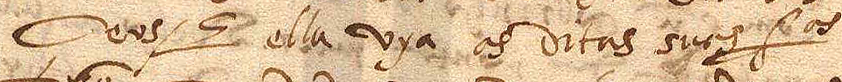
Ceos / E ella vya as ditas suas fas
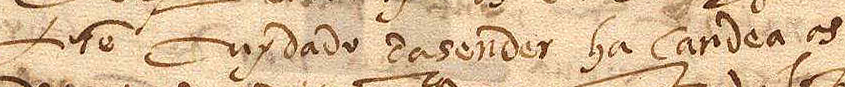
terē cuydado dasender ha candea as
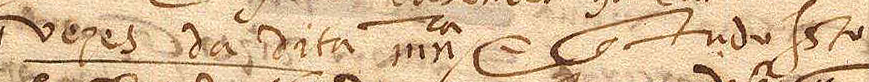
vezes da dita mnra / e q̄ tudo Jsto
